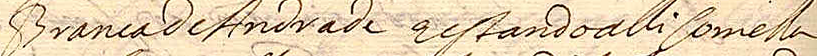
Branca de Andrade E estando alli Com ella
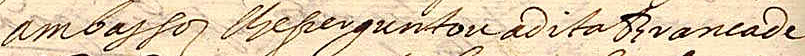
ambas sos lhe perguntou a dita Branca de
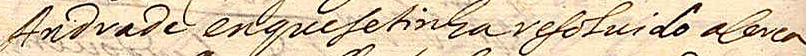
Andrade en que se tinha resoluido aCerca
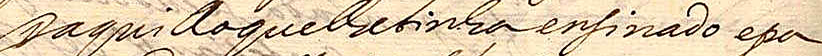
Daquillo que lhe tinha ensinado e pa
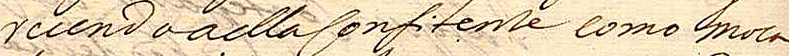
recendo a ella Confitente como moca
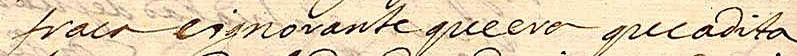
fraca e ignorante que era que a dita
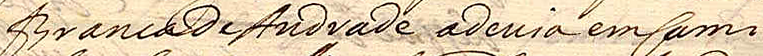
Branca de Andrade a deuia emCami
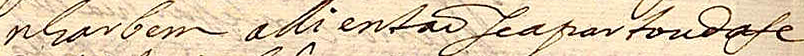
nhar bem alli entaõ se apartou da fe
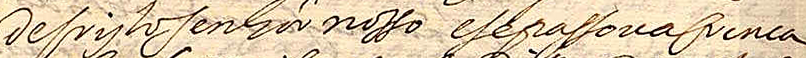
de Cristo Senhor̄ nosso e se passou a Crenca
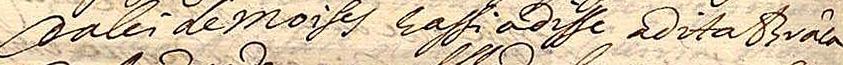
da lei de Moises E assi o disse a dita Brāca
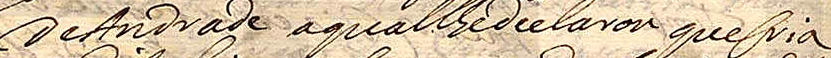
de Andrade a qual lhe declarou que Cria
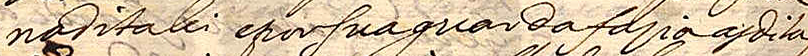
na dita lei e por sua guarda fazia as ditas
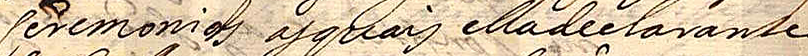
Ceremonias as quais ella declarante
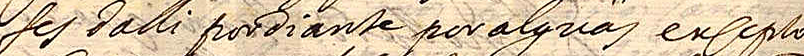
fes dalli por diante por alguās exCepto
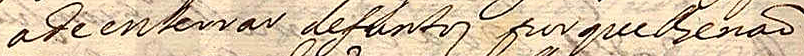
a de enterrar defuntos porque lhe não
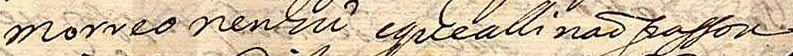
morreo nenhū e que alli não passou
